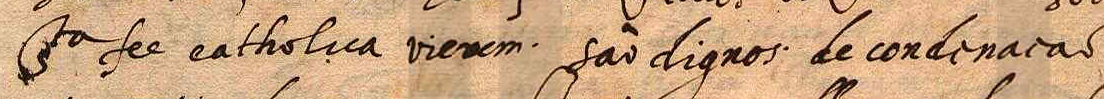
sta fee catholica vierem saõ dignos de condenaçaõ
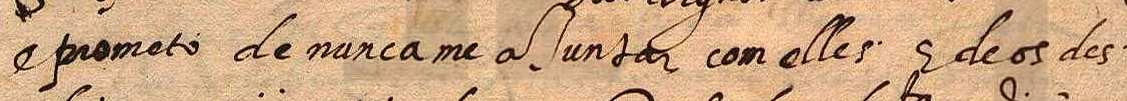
e prometo de nunca me aJuntar com elles E de os des
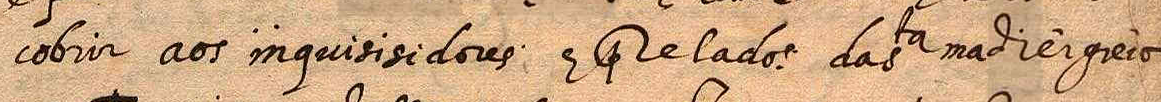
cobrir aos inquisisidores E prelados da sta madre igreia
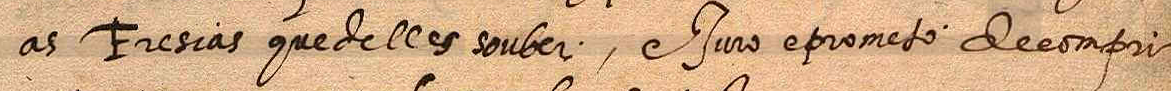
as Eresias que delles souber, e Juro e prometo de comprir
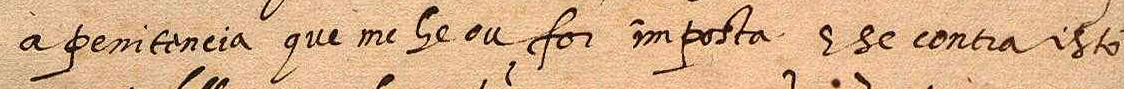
a penitencia que me he ou for imposta E se contra isto
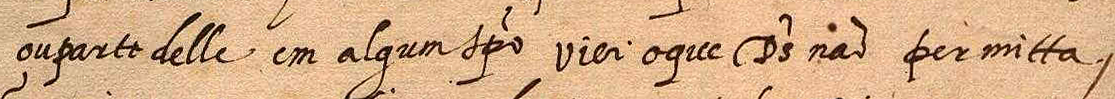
ou parte delle em algum tpō vier o que Ds̄ naõ permitta,
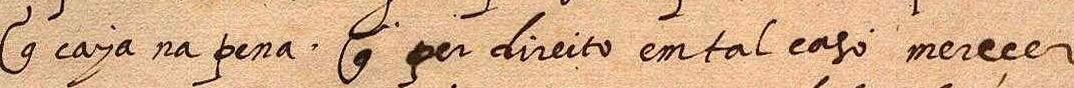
q̄ caya na pena q̄ per direito em tal caso merecer
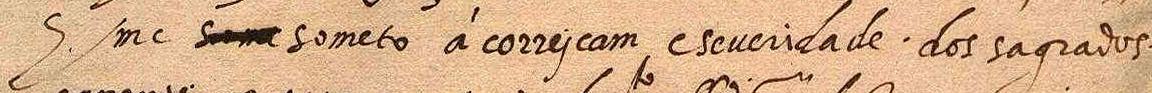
E me _ someto á correjçam e seueridade dos sagrados
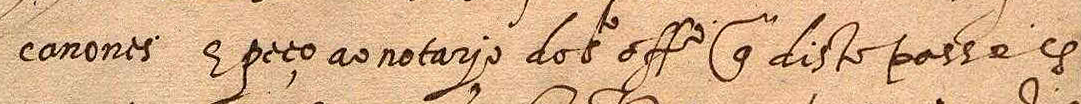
canones E peço ao notarjo do sto offo q̄ disto passe es
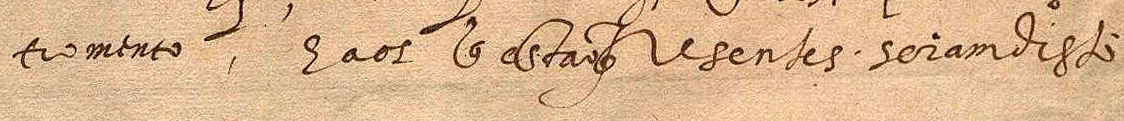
tromento, E aos q̄ estaõ presentes seiam disto
